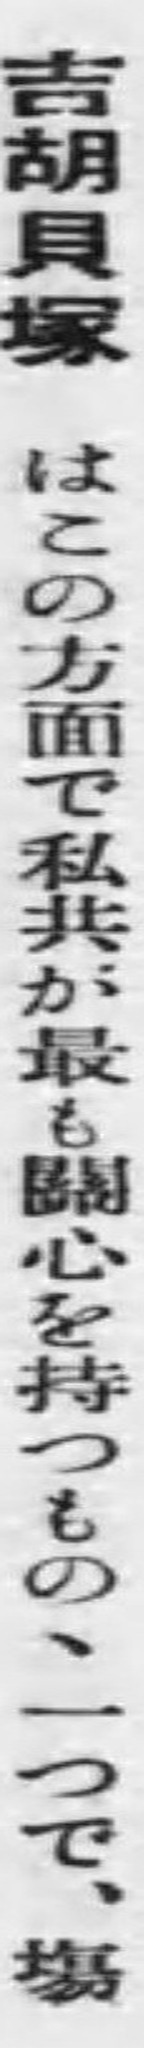吉胡貝塚はこの方面で私共が最も関心を持つものゝ一つで、場
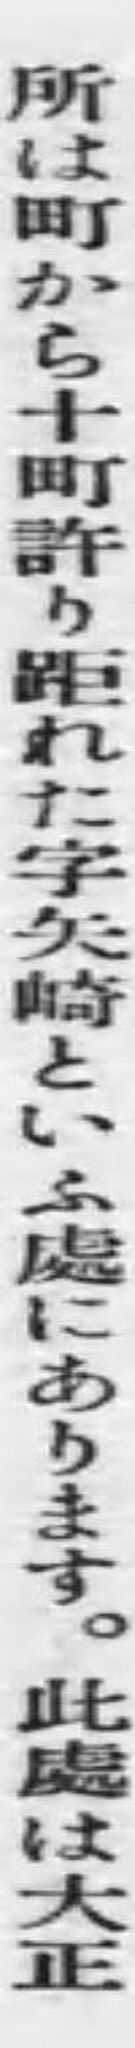所は町から十町許り距れた字矢崎といふ処にあります。此処は大正
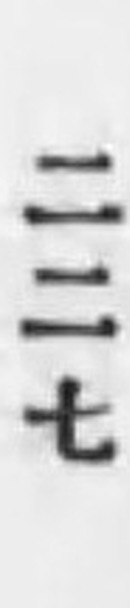二二七

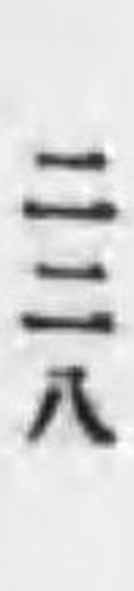二二八
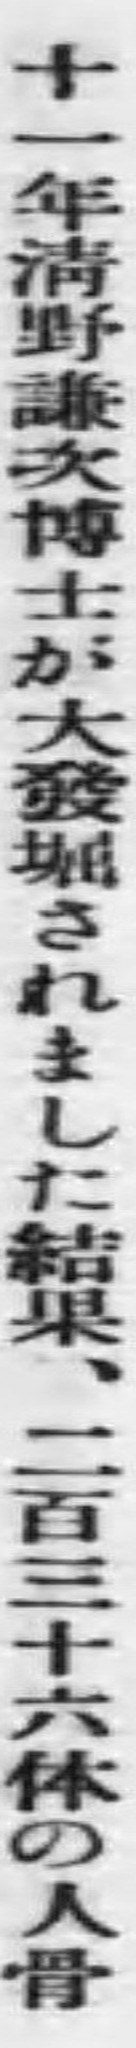十一年清野謙次博士が大発堀されました結果、二百三十六体の人骨
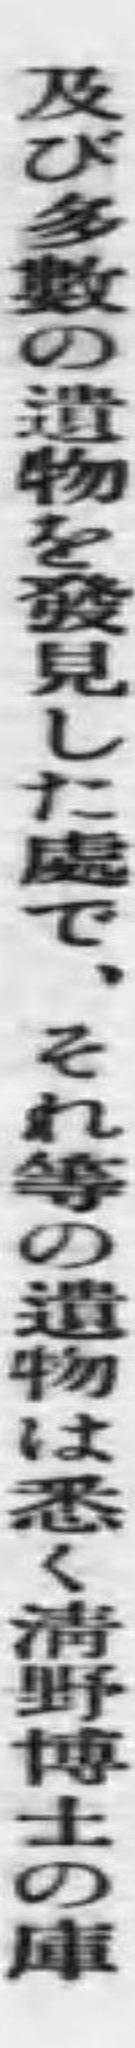及び多数の遺物を発見した処で、それ等の遺物は悉く清野博士の庫
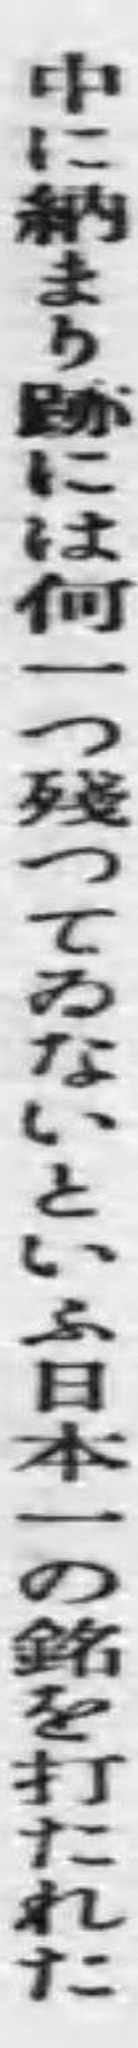中に納まり跡には何一つ残つてゐないといふ日本一の銘を打たれた
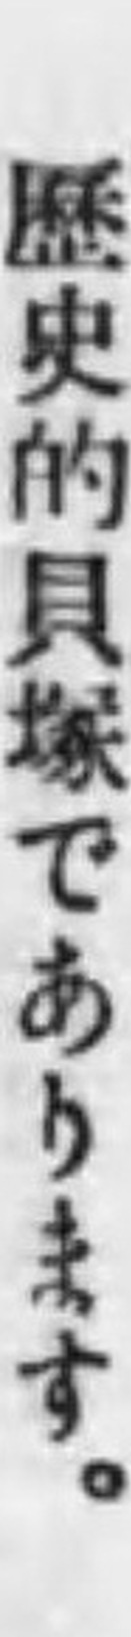歴史的貝塚であります。
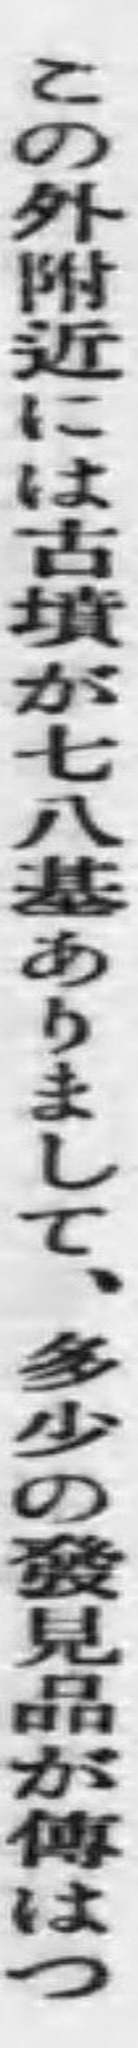この外附近には古墳が七八基ありまして、多少の発見品が伝はつ
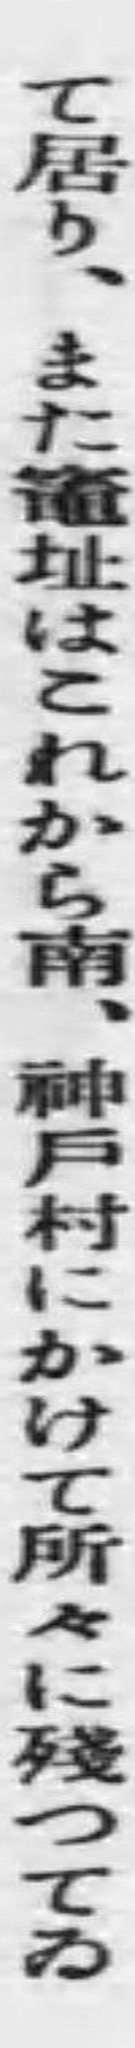て居り、また竈址はこれから南、神戸村にかけて所々に残つてゐ
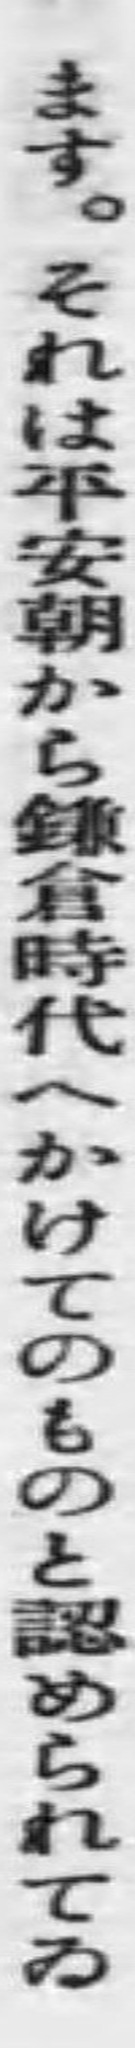ます。それは平安朝から鎌倉時代へかけてのものと認められてゐ
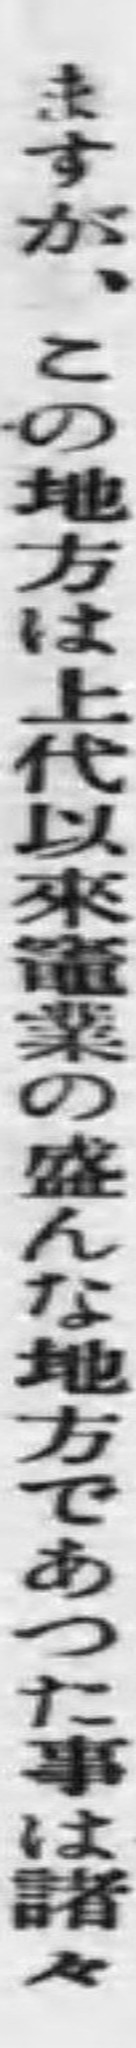ますが、この地方は上代以来竈業の盛んな地方であつた事は諸々
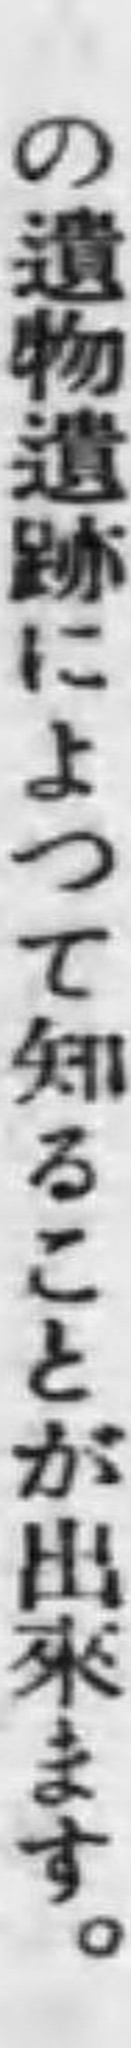の遺物遺跡によつて知ることが出来ます。
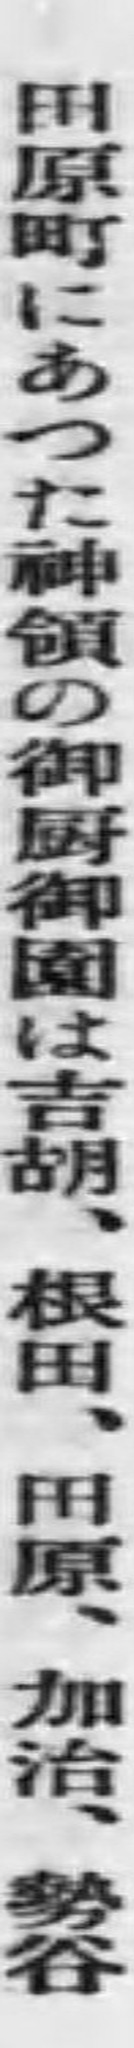田原町にあつた神領の御厨御園は吉胡、根田、田原、加治、勢谷
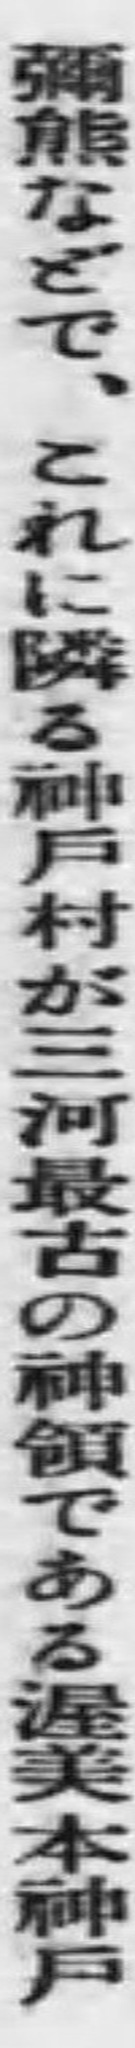弥熊などで、これに隣る神戸村が三河最古の神領である渥美本神戸
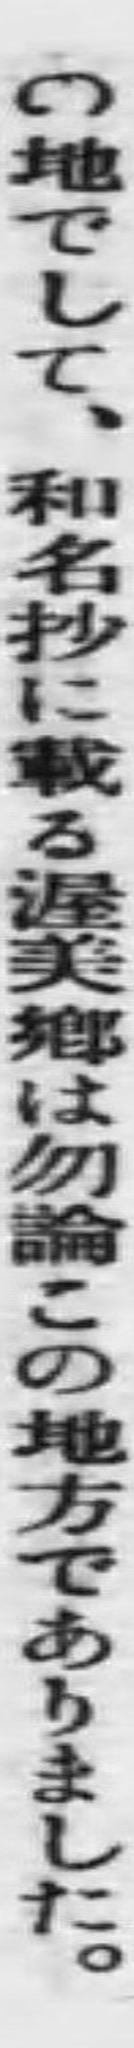の地でして、和名抄に載る渥美郷は勿論この地方でありました。
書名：東三河道中記 : 豊橋市及其附近案内
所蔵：国立国会図書館 National Diet Library, JAPAN
